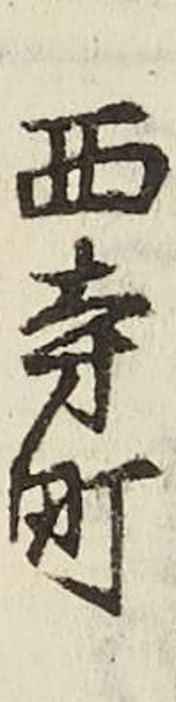西寺町
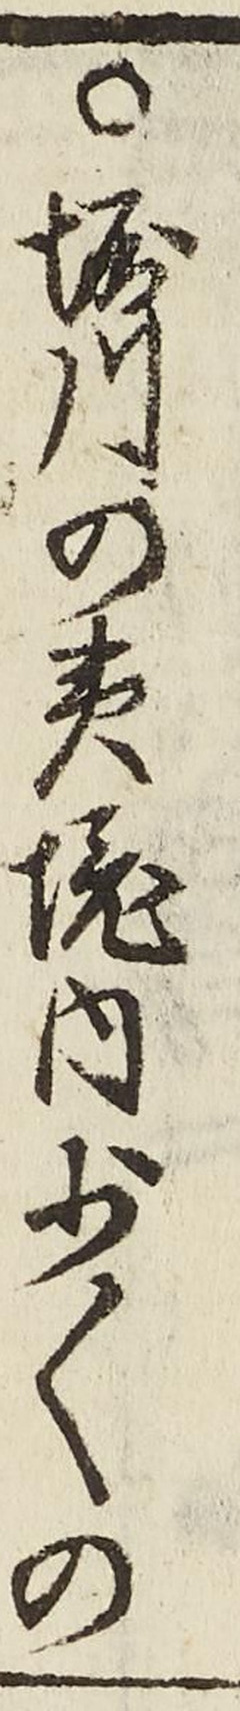〇堀川の夷境内少々の
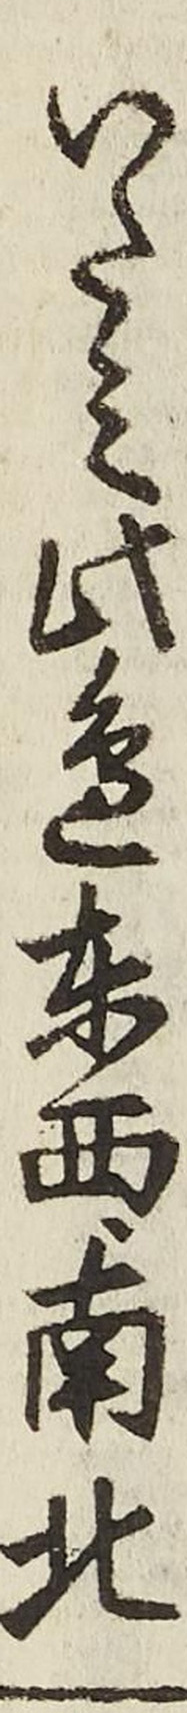いたみ此辺東西南北
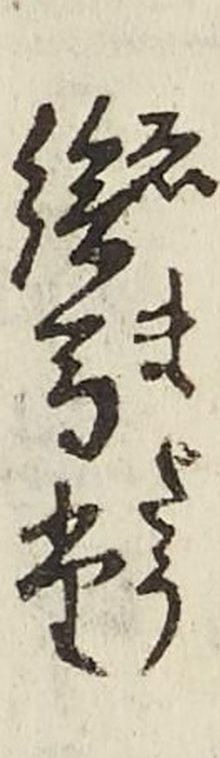絵馬堂
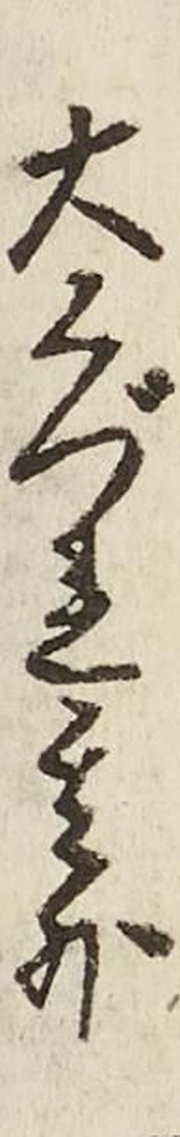大くづれ其外
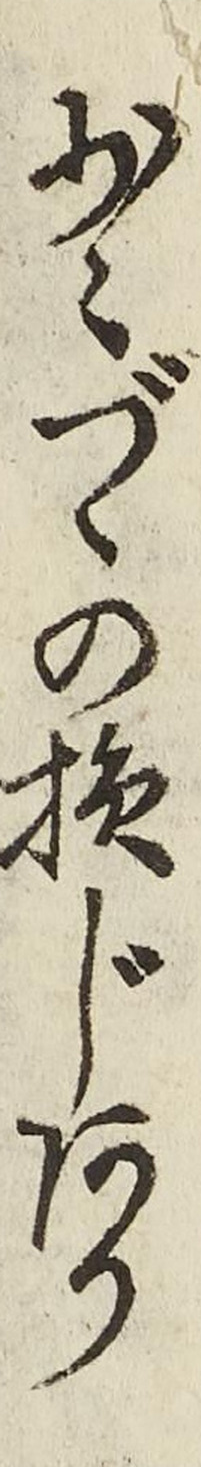少々づゝの損じあり
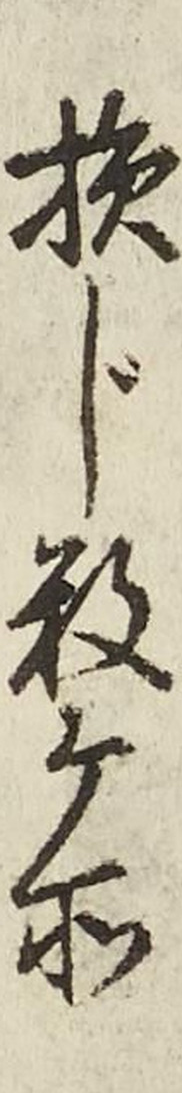損じ数ヶ所
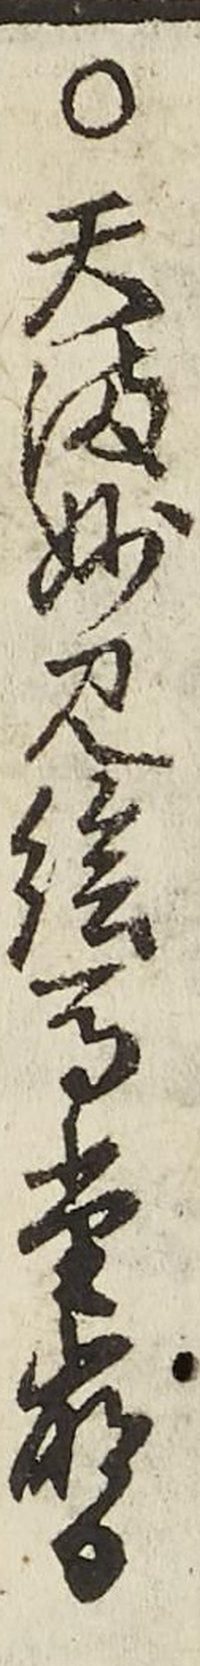〇天満妙見絵馬堂崩る

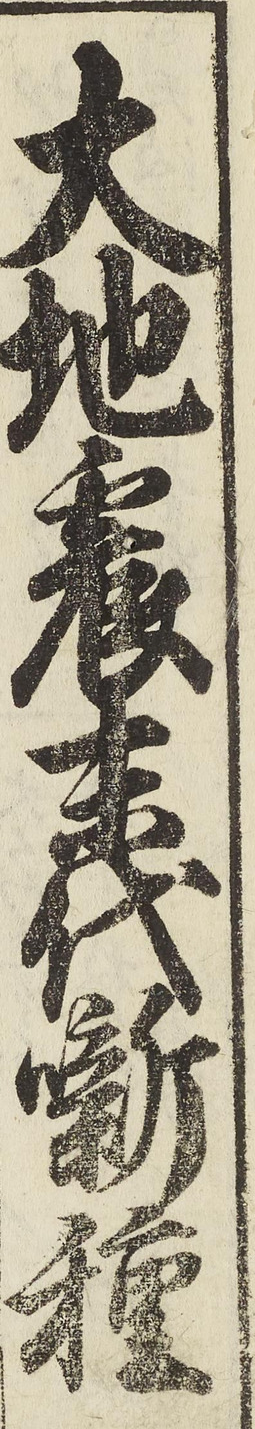大地震末代噺種
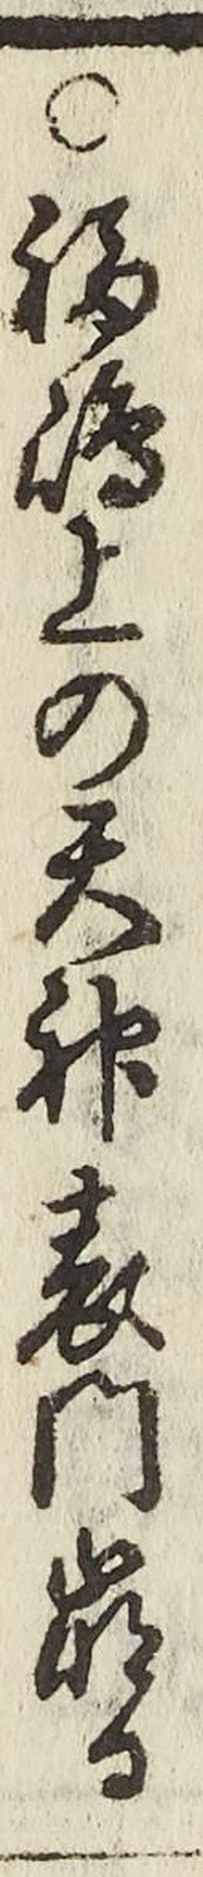〇福嶋上の天神表門崩る
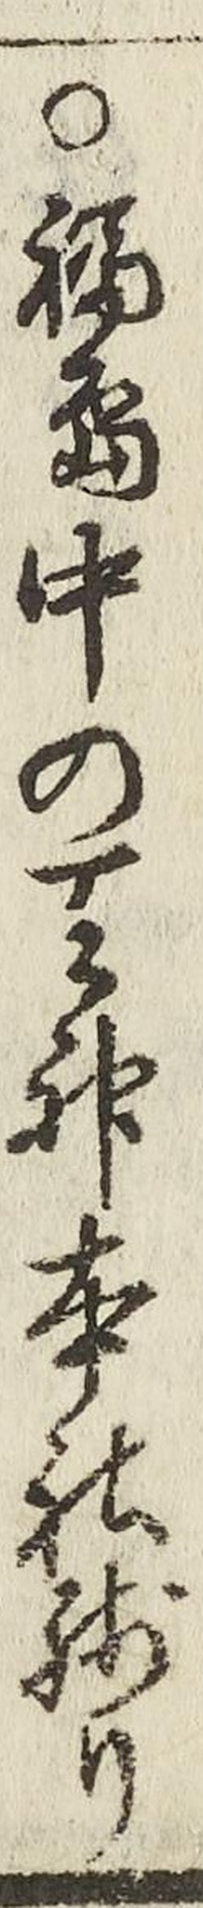〇福島中の天神本社残り
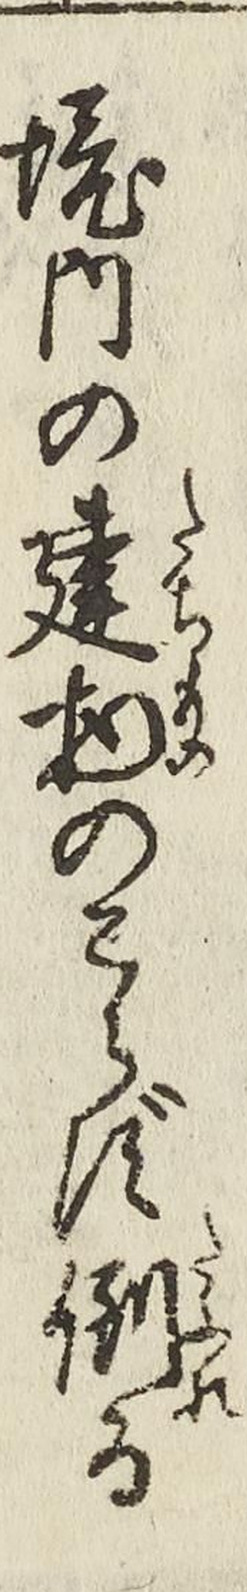境内の建物のこらず倒る
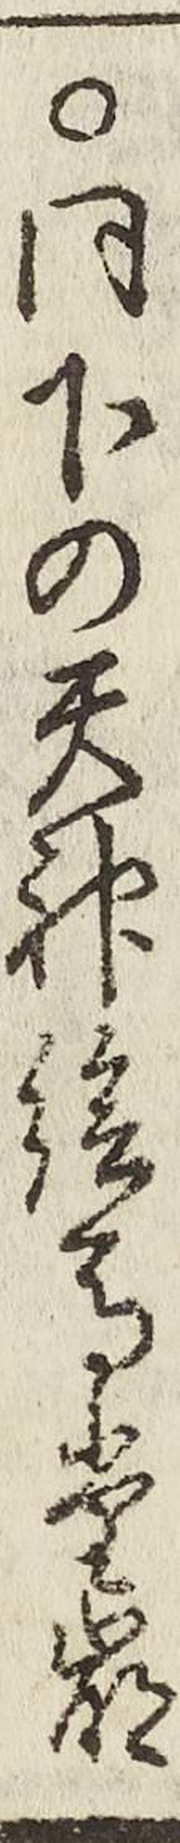〇同下の天神絵馬堂崩
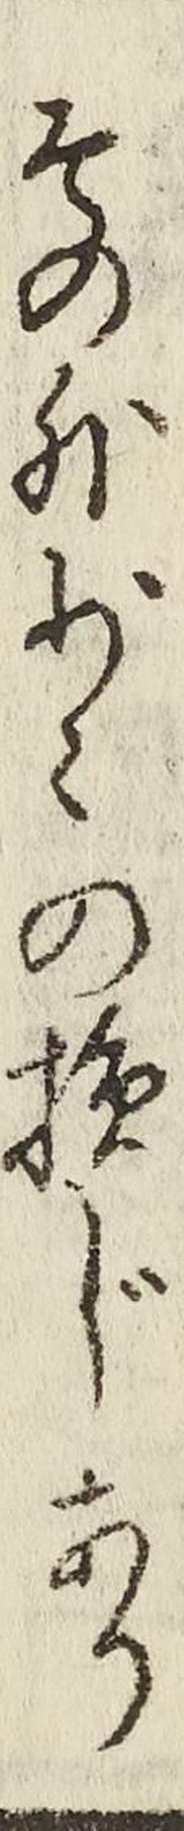その外少々の損じあり
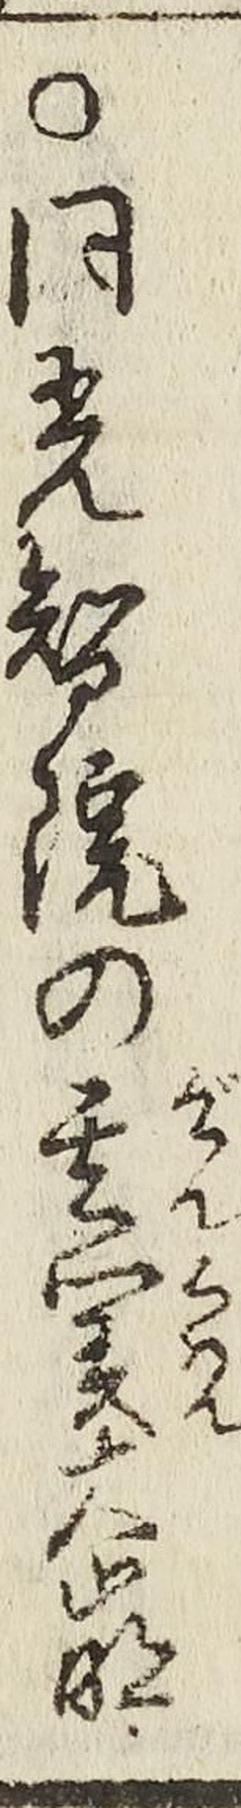〇同光智院の玄関大崩
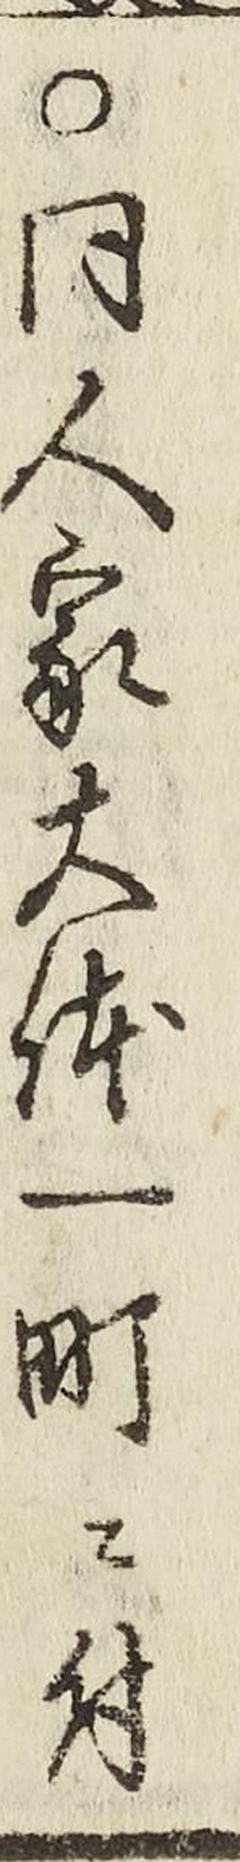〇同人家大体一町ニ付
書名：地震津浪末代噺の種　全
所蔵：東京大学地震研究所図書室 Earthquake Research Institute Library, The University of Tokyo, JAPAN
